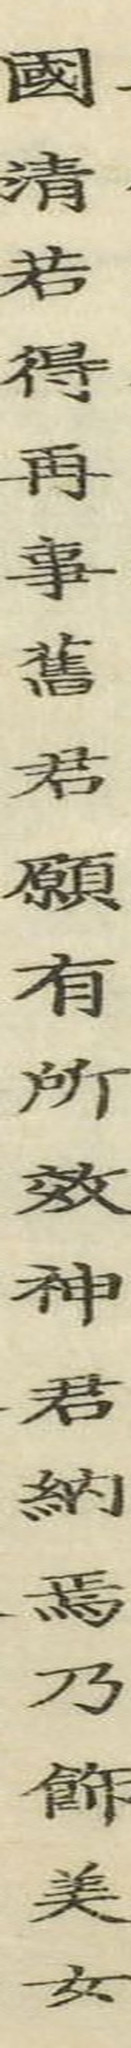國清若得再事𦾔君願有所效神君納焉乃飾美女
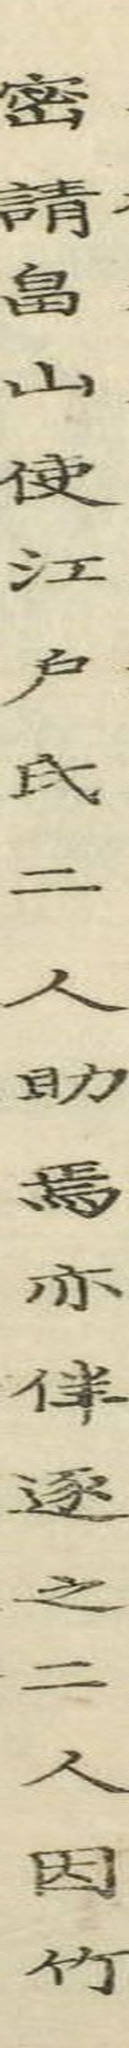密請畠山使江戸氏二人助焉亦伴逐之二人因竹
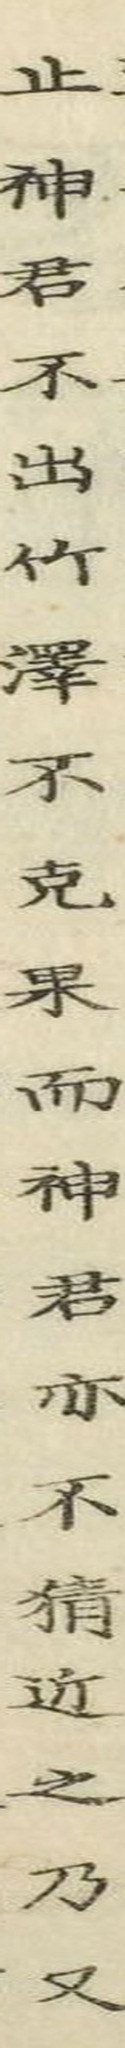止神君不出竹澤不克果而神君亦不猜近之乃又
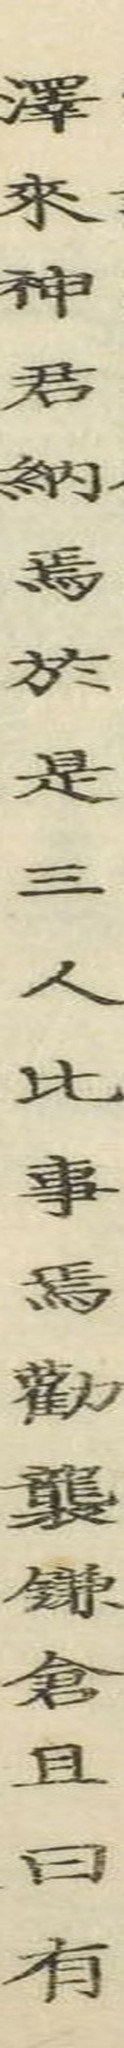澤來神君納焉於是三人比事焉勤襲鎌倉且曰有
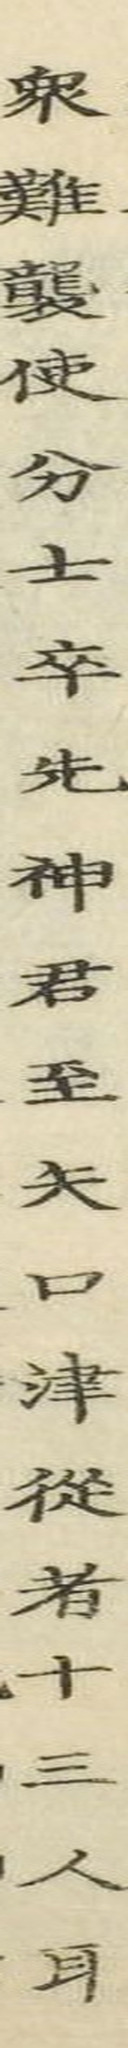衆難襲使分士卒先神君至矢口津從者十三人耳
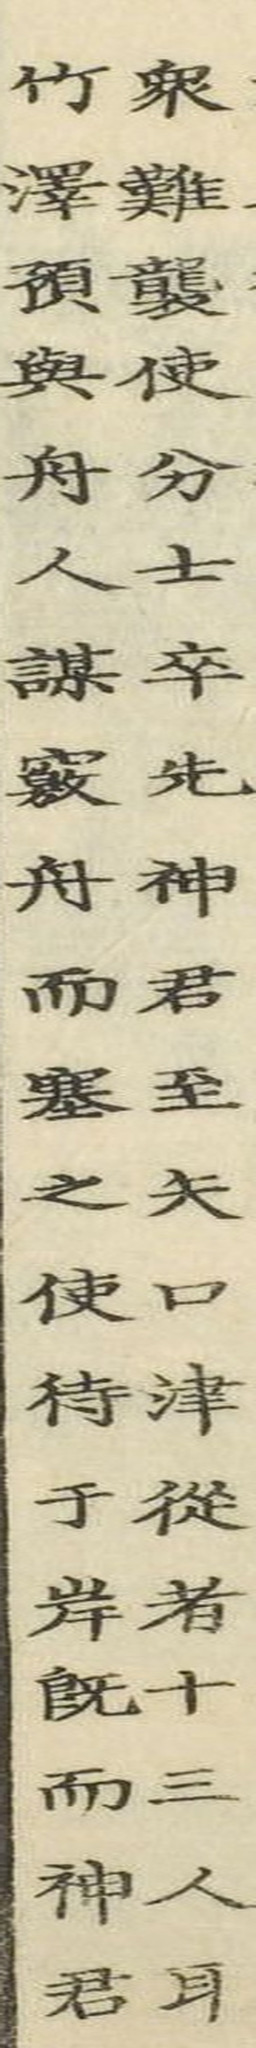竹澤預與舟人謀竅舟而塞之使待于岸既而神君
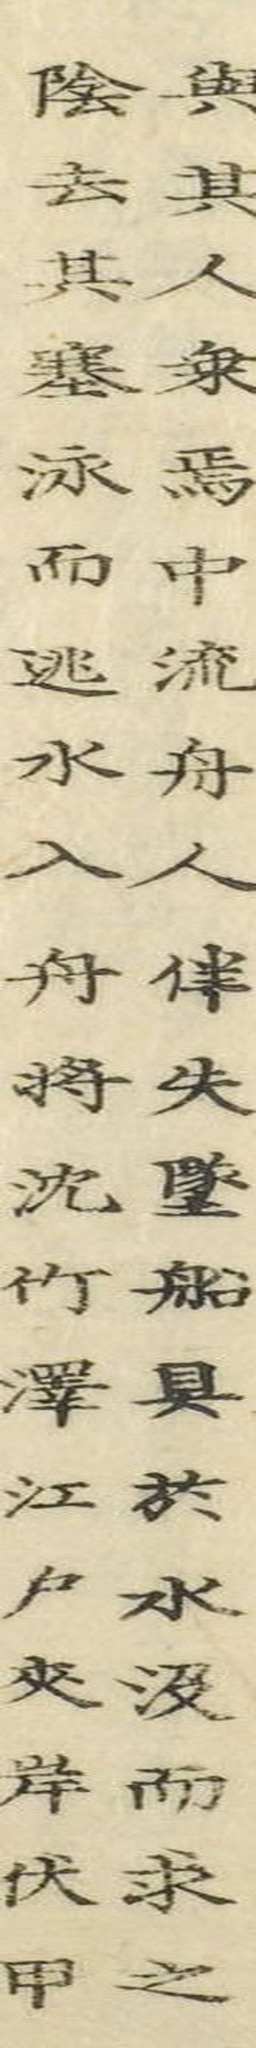陰去其塞泳而逃水入舟將沈竹澤江戸夾岸伏甲
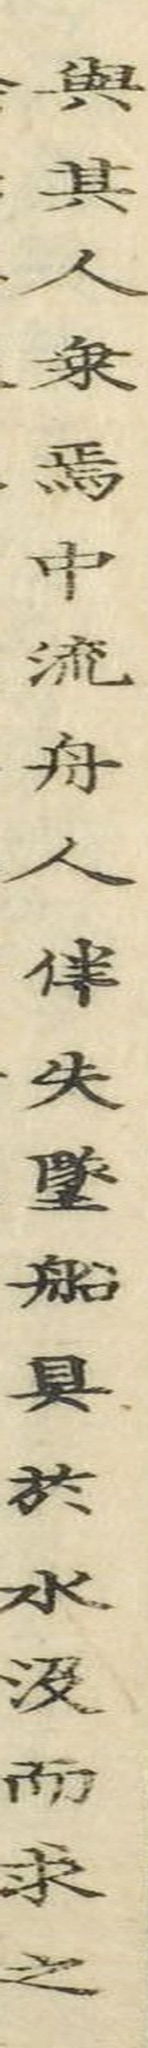與其人乗焉中流舟人伴失墜船具於水汲而求之
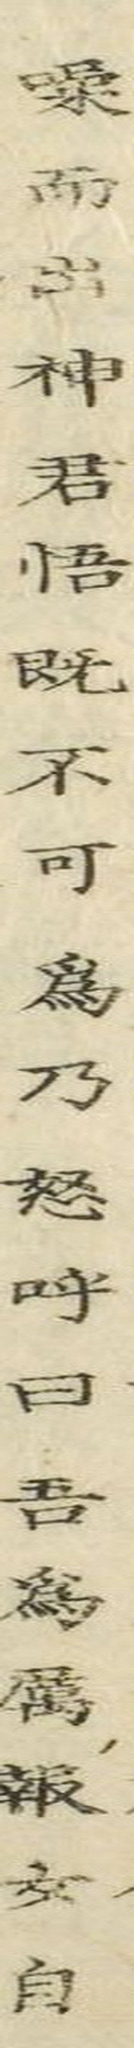噪而出神君悟既不可爲乃怒呼曰吾爲属報女自
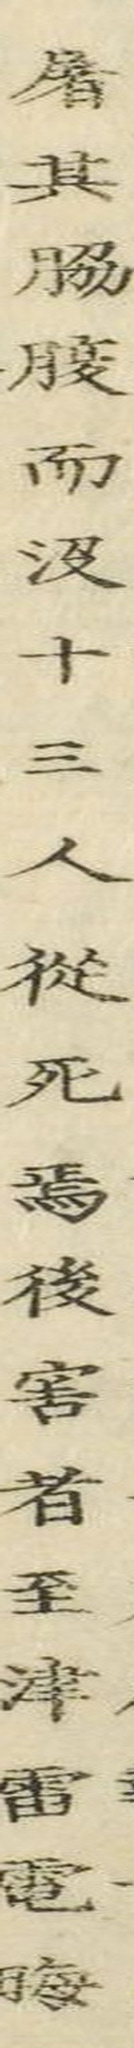屠其脇腹而沒十三人從死焉後害者至津雷電晦
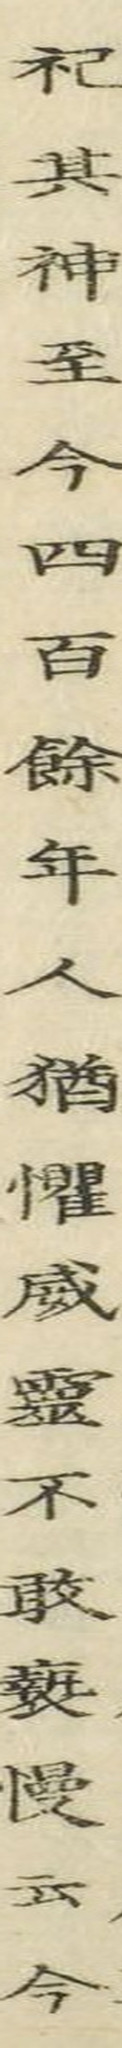祀其神至今四百餘年人猶懼威靈不敢褻慢云今
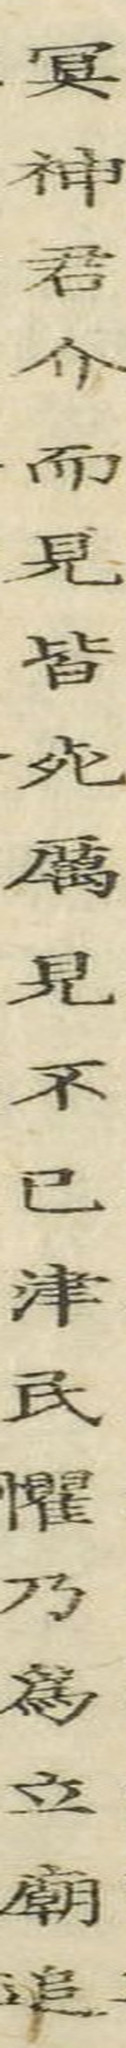冥神君介而見皆死厲見不已津民懼乃爲立廟追
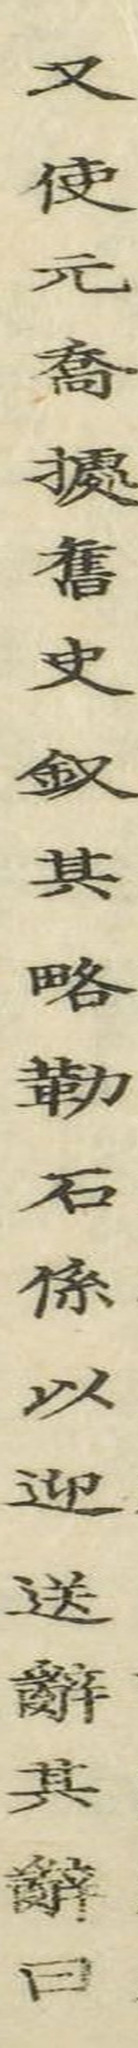又使元喬㨿𦾔史𨥁其略勒石係以迎送辭其辭曰
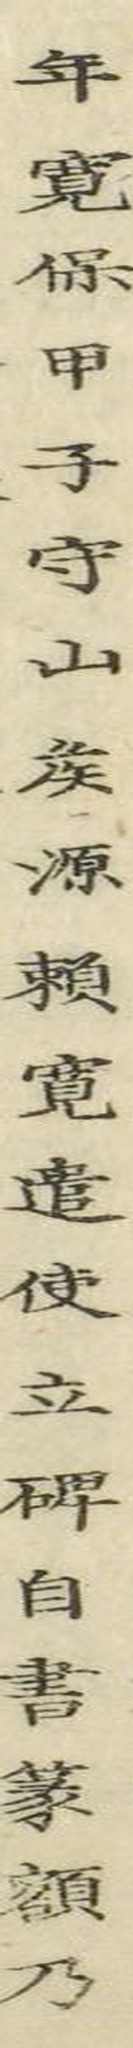年寛保甲子守山矦源頼寛遣使立碑自書篆額乃
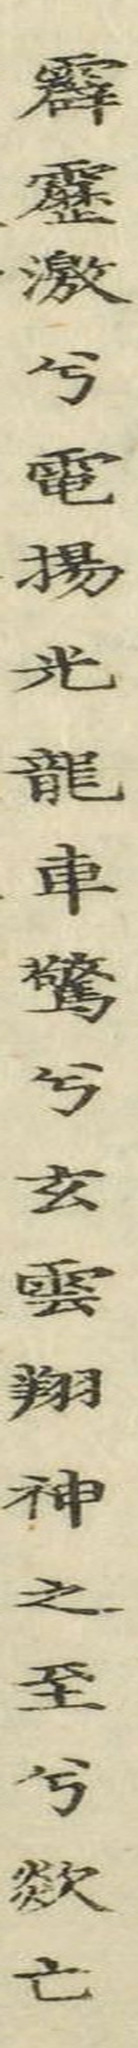霹靂激兮電揚光龍車驚兮玄雲翔神之至兮欻亡
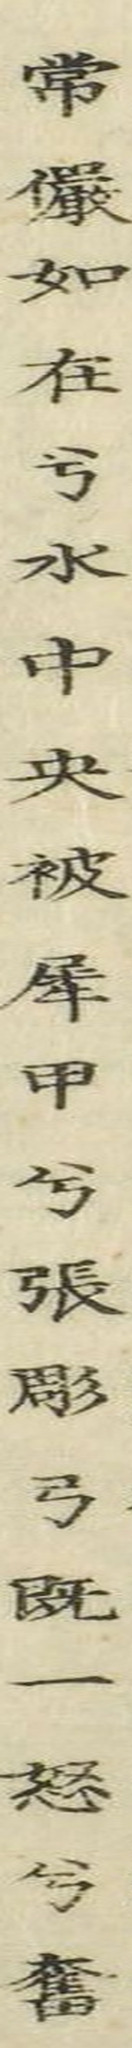常儼如在兮水中央被犀甲兮張彫弓既一怒兮奮
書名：江戸名所図会 20巻 巻之4
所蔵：東京学芸大学教育コンテンツアーカイブ
